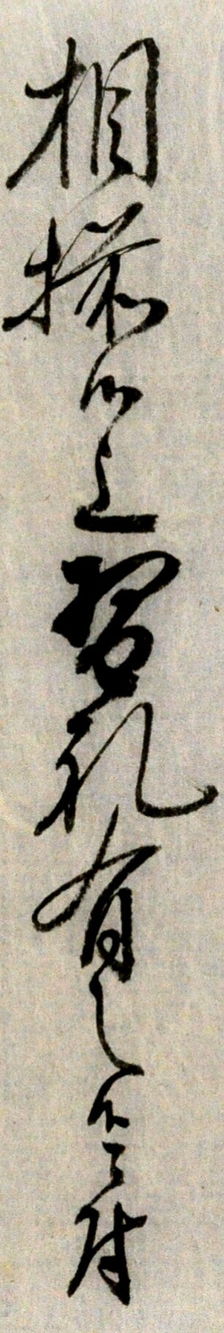相揃候上習礼有之候に付
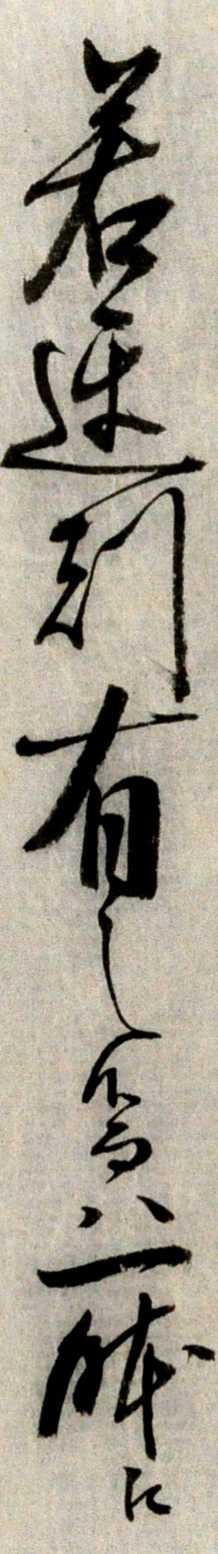若遅刻有之候ては一体え
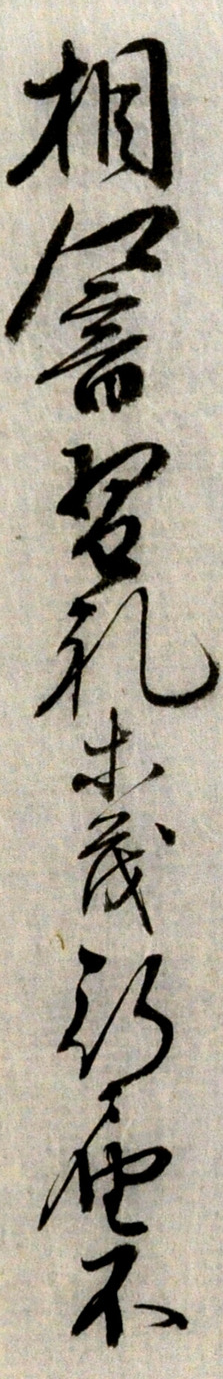相響習礼等も行届不
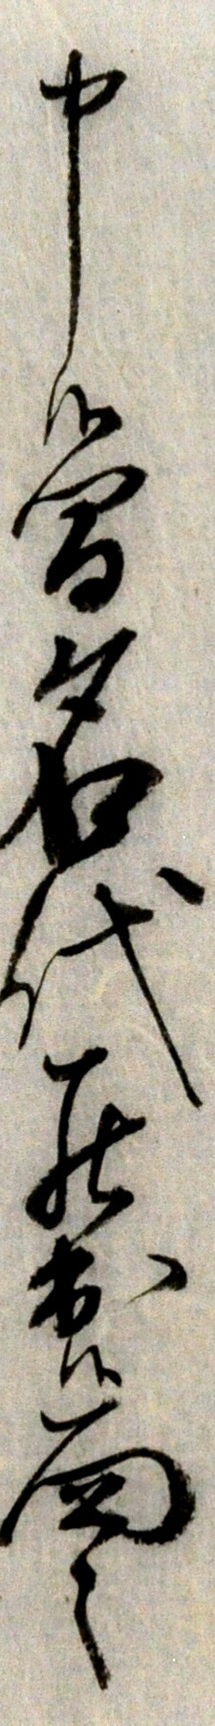申候間名代罷出候面々

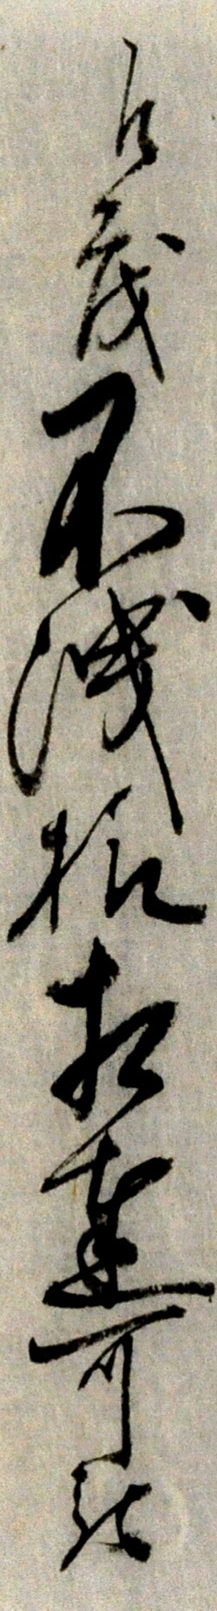えも不洩様相達可被
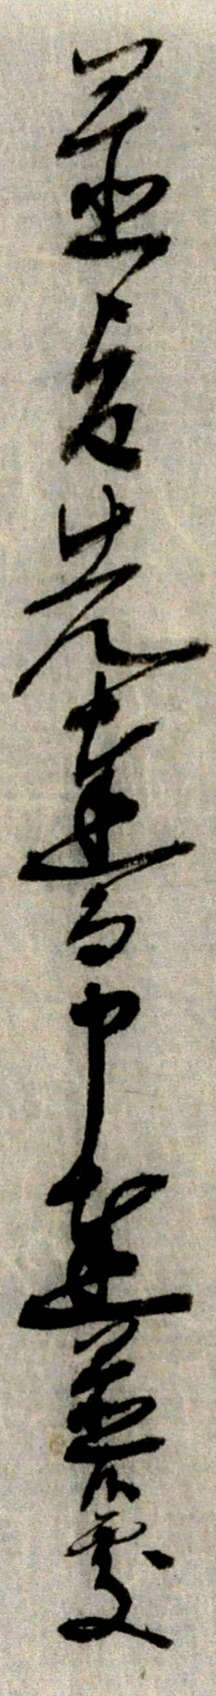置旨先達て申達置候処
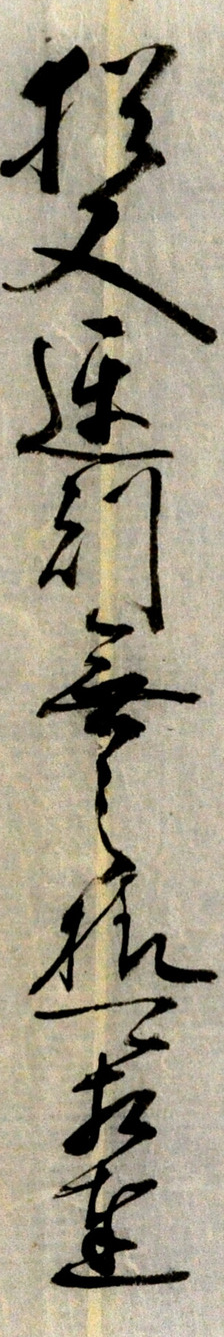猶又遅刻無之様可相達
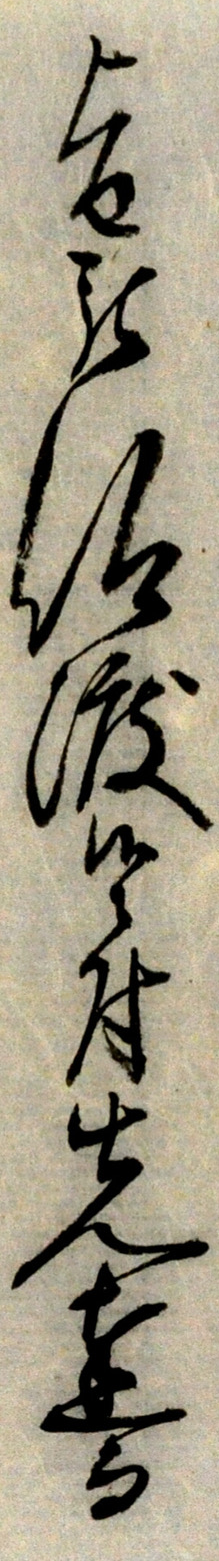旨被仰渡候に付先達て
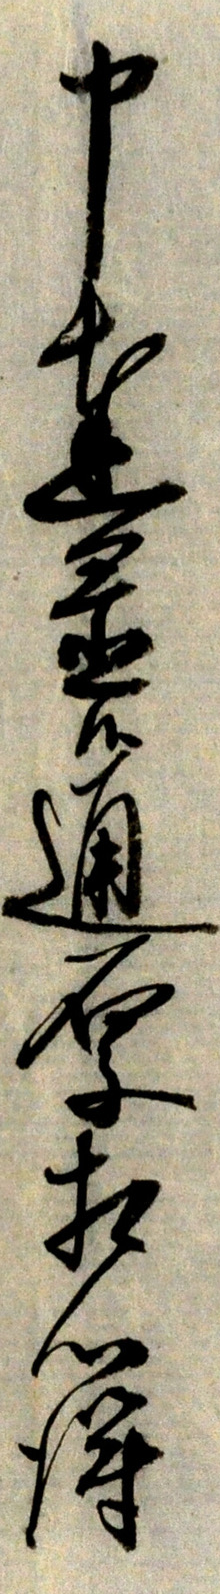申達置候通厚相心得
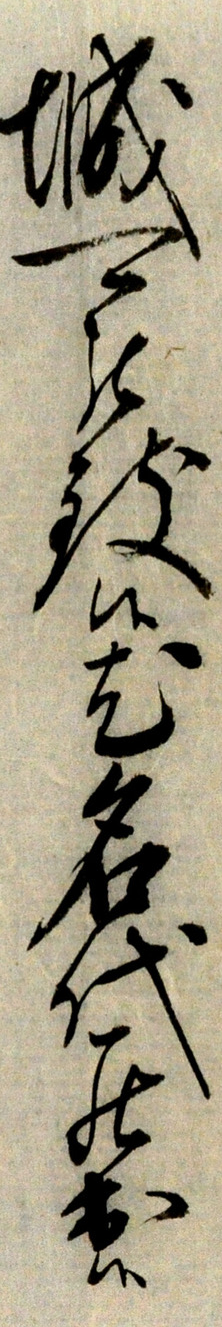城可被致候尤名代罷出候
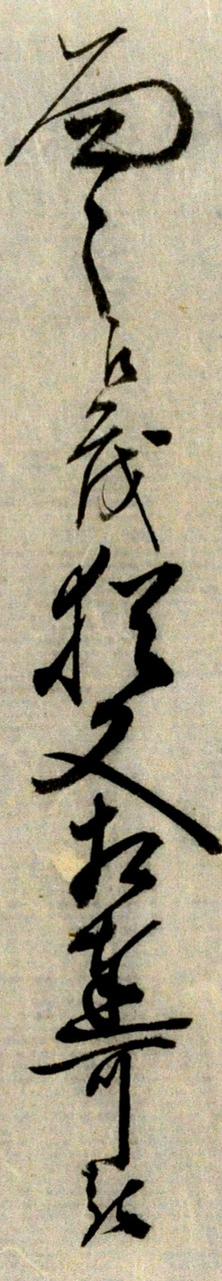面々えも猶又相達可被
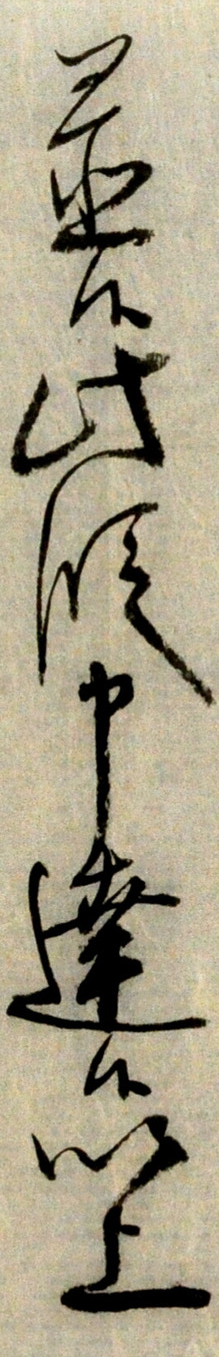置候此段申達候以上
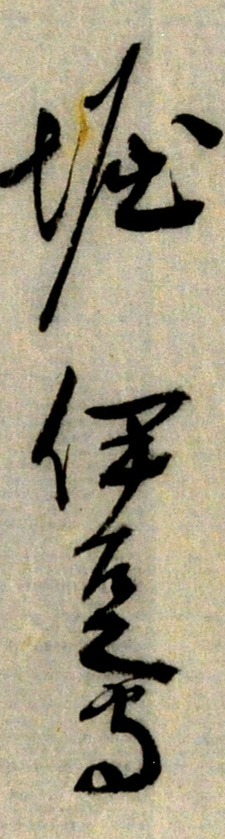堀伊豆守

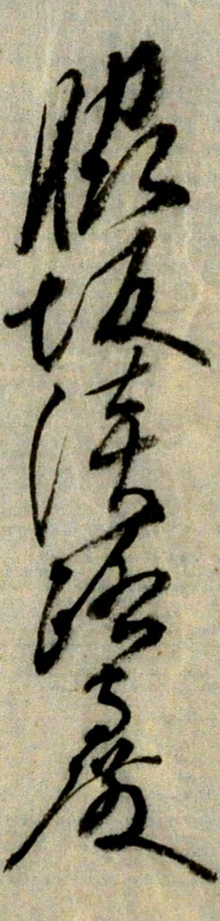脇坂淡路守殿
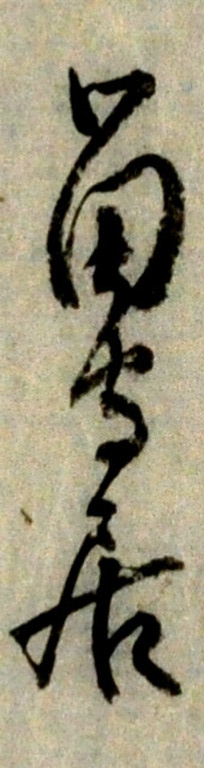留守居
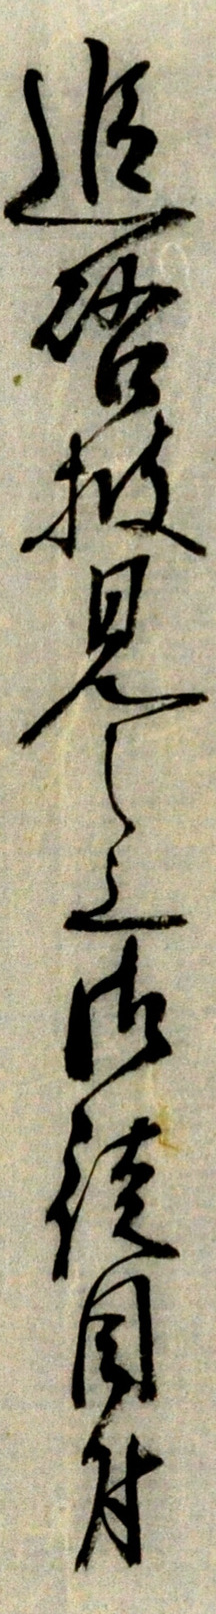追啓披見之上御徒目付
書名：申合帳〔一括〕
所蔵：伊那市立高遠町図書館・合同会社AMANE
